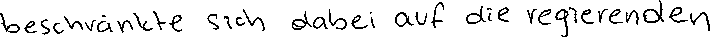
beschränkte sich dabei auf die regierenden
